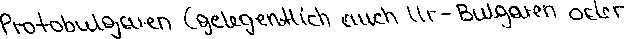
Protobulgaren (gelegentlich auch Ur-Bulgaren oder
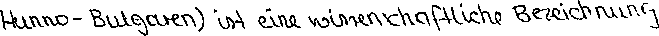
Hunno-Bulgaren) ist eine wissenschaftliche Bezeichnung
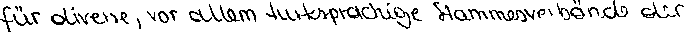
für diverse, vor allem turksprachige Stammesverbände der
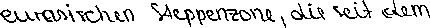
eurasischen Steppenzone, die seit dem
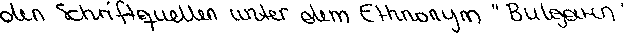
den Schriftquellen unter dem Ethnonym "Bulgaren"
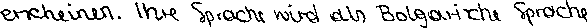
erscheinen. Ihre Sprache wird als Bolgarische Sprache
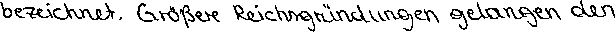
bezeichnet. Größere Reichsgründungen gelangen den
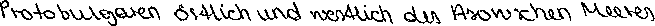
Protobulgaren östlich und westlich des Asowschen Meeres
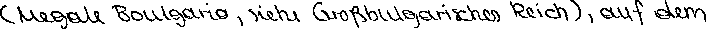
(Megale Boulgaria, siehe Großbulgarisches Reich), auf dem
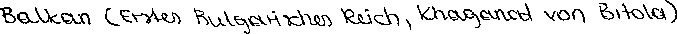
Balkan (Erstes Bulgarisches Reich, Khaganat von Bitola)
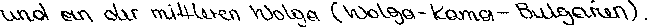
und an der mittleren Wolga (Wolga-Kama-Bulgarien).
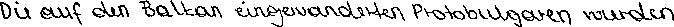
Die auf den Balkan eingewanderten Protobulgaren wurden
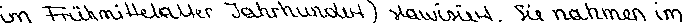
im Frühmittelalter Jahrhundert) slawisiert. Sie nahmen im
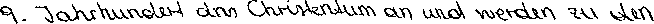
9. Jahrhundert das Christentum an und werden zu den
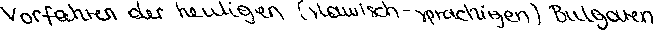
Vorfahren der heutigen (slawisch-sprachigen) Bulgaren
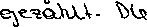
gezählt. Die
